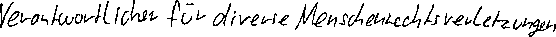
Verantwortlicher für diverse Menschenrechtsverletzungen
